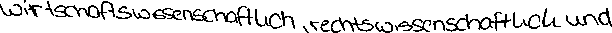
wirtschaftswissenschaftlich, rechtswissenschaftlich und
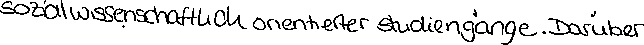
sozialwissenschaftlich orientierter Studiengänge.Darüber
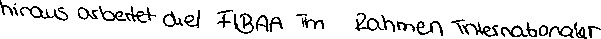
hinaus arbeitet die FIBAA im Rahmen internationaler
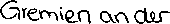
Gremien an der
